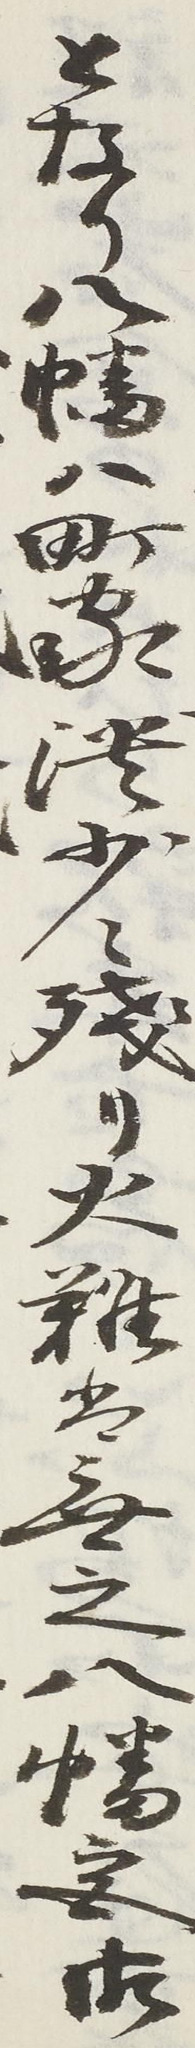となり八幡ハ町家潰少々残り火難は無之八幡宮御
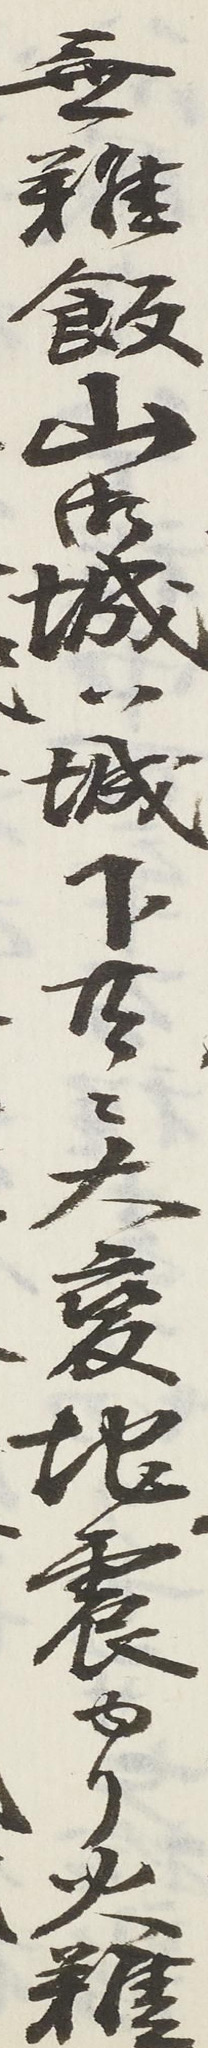無難飯山御城ハ城下共々大変地震ゆり火難
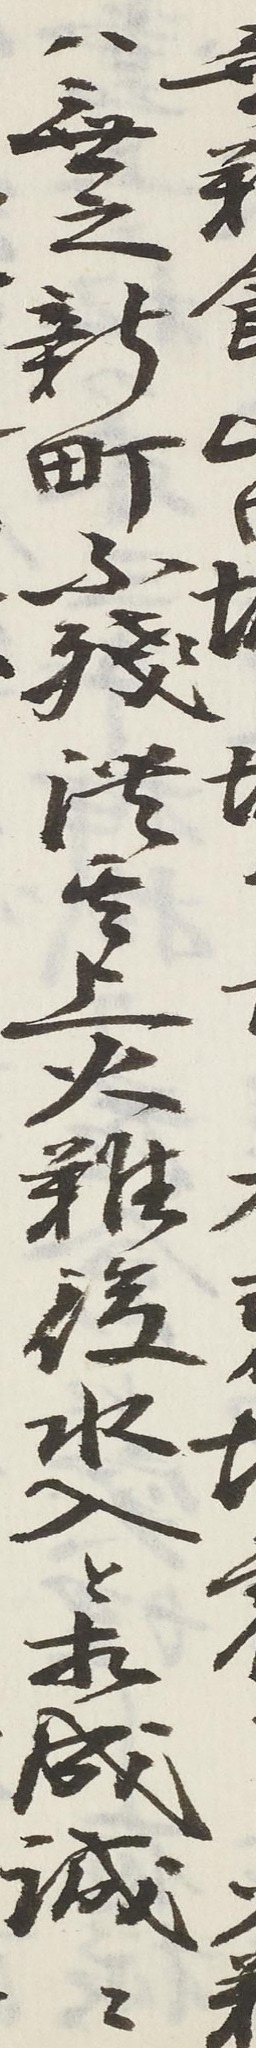ハ無之新町不残潰其上火難後水入と相成誠二
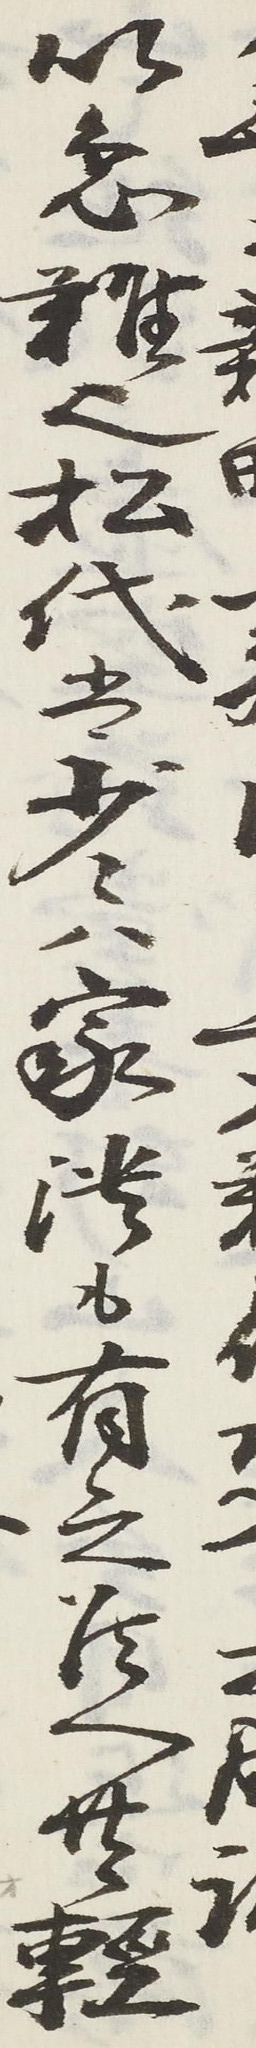以急難也松代は少々ハ家潰も有之候へ共軽
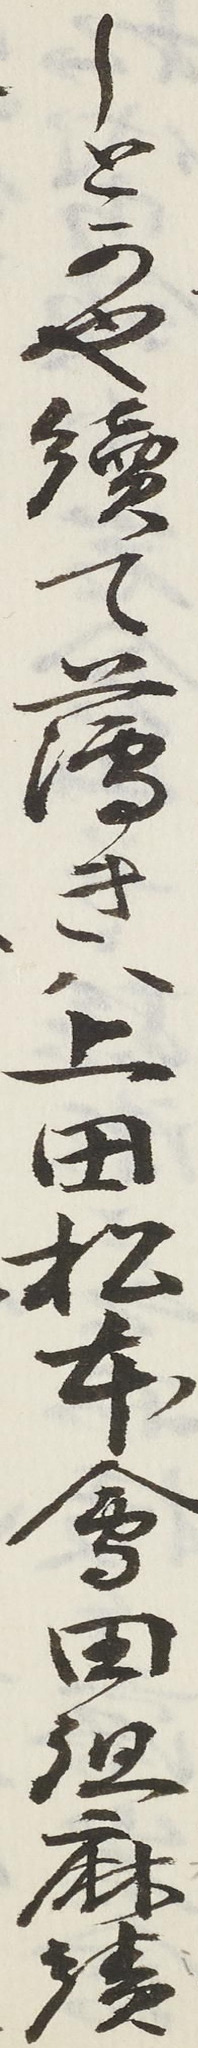しとかや続て薄きハ上田松本会田組麻績
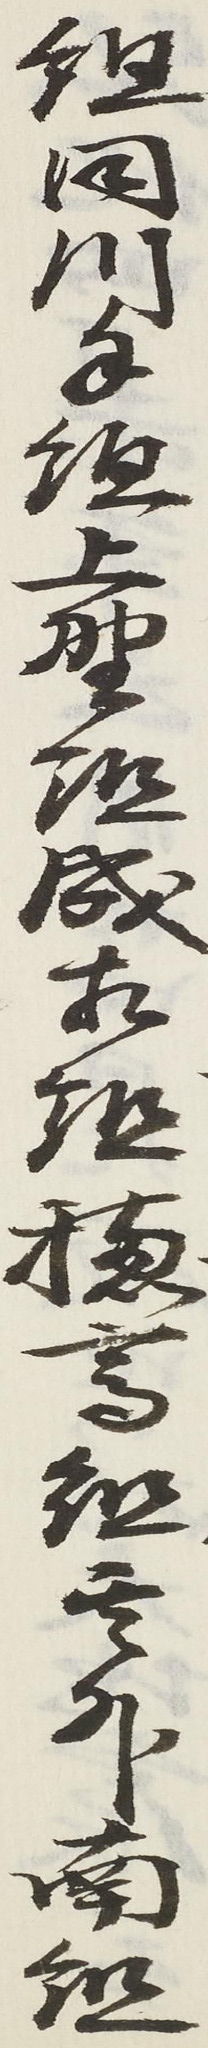組同川手組上野組成相組穂高組其外南組
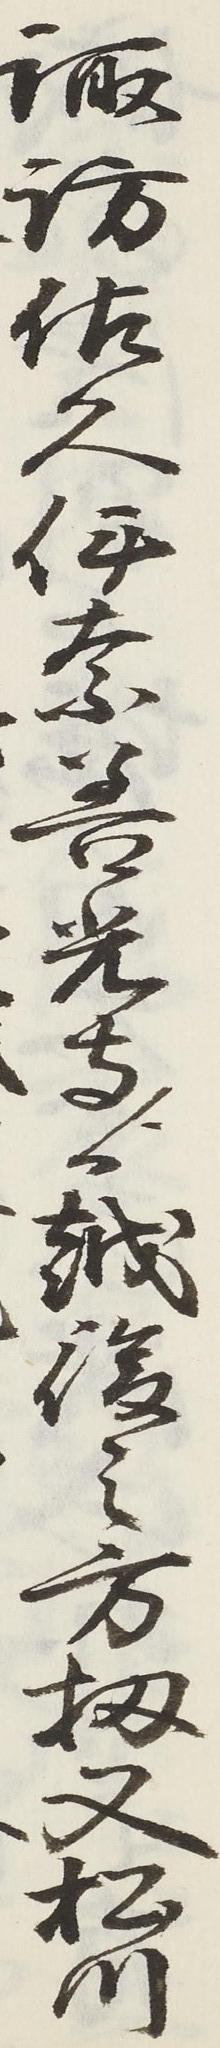諏訪佐久伊奈善光寺ゟ越後之方扨又松川
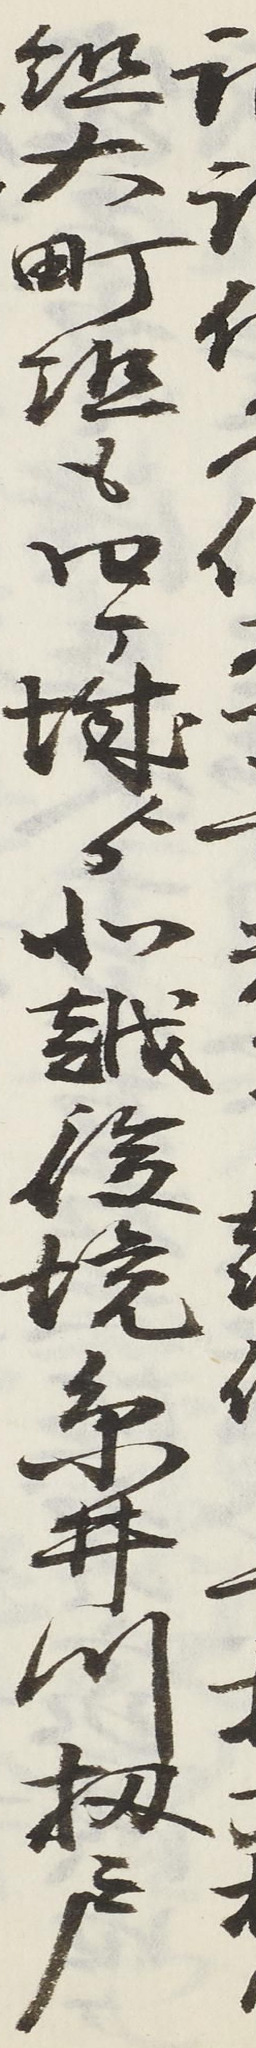組大町組も四ヶ城ゟ北越後境糸井川扨戸
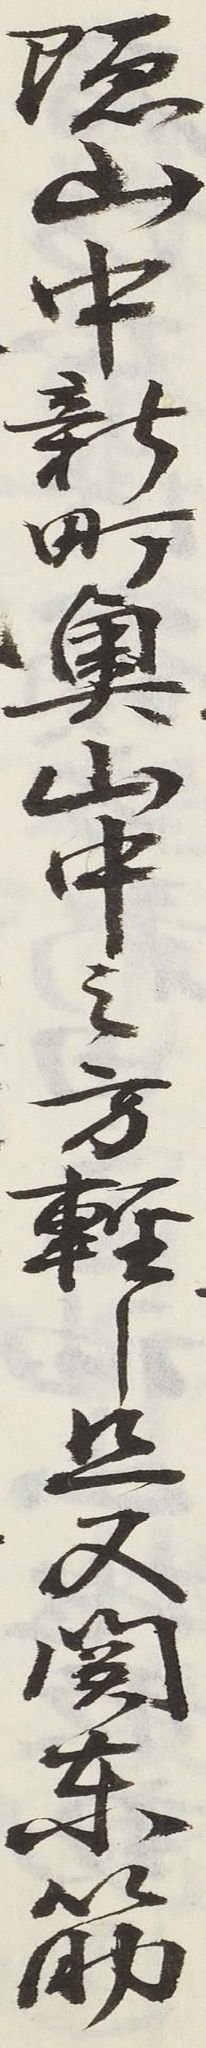隠山中新町奥山中之方軽し且又関東筋
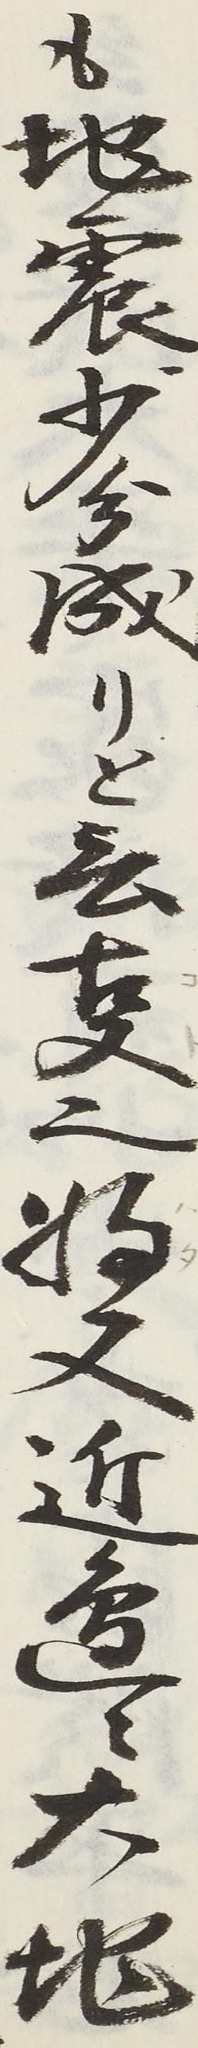も地震少分成りと云事也将又近辺二大地
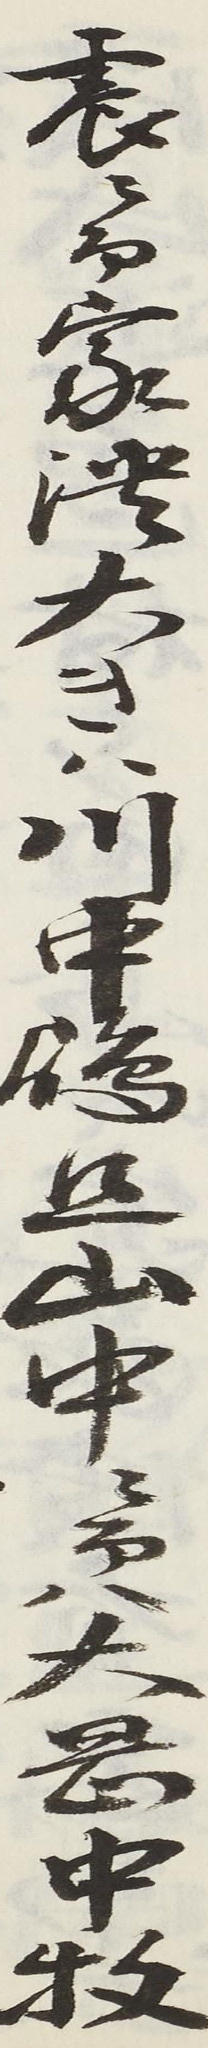震二而家潰大きハ川中嶋且山中二而ハ大岡中牧
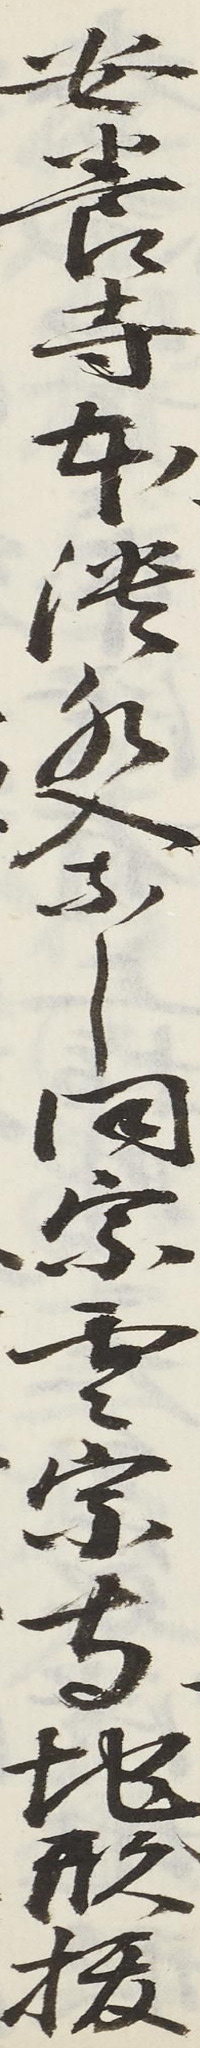安養寺本潰水入なし同宗雲宗寺地形抜
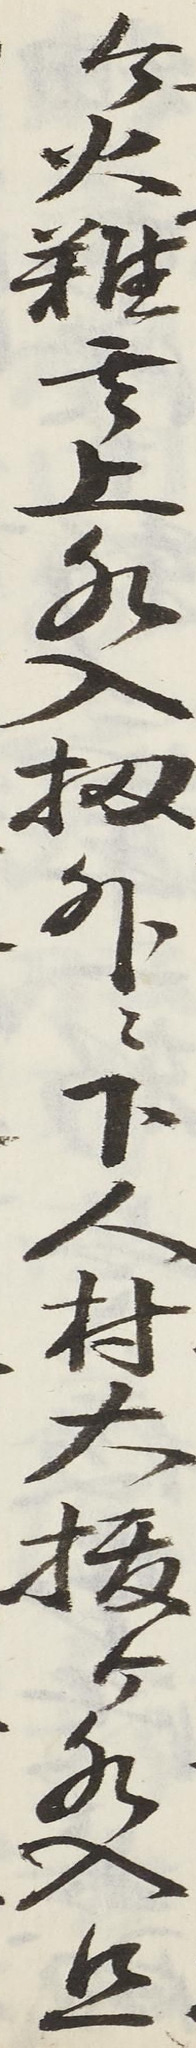ヶ火難其上水入扨外二下人村大抜ヶ水入且
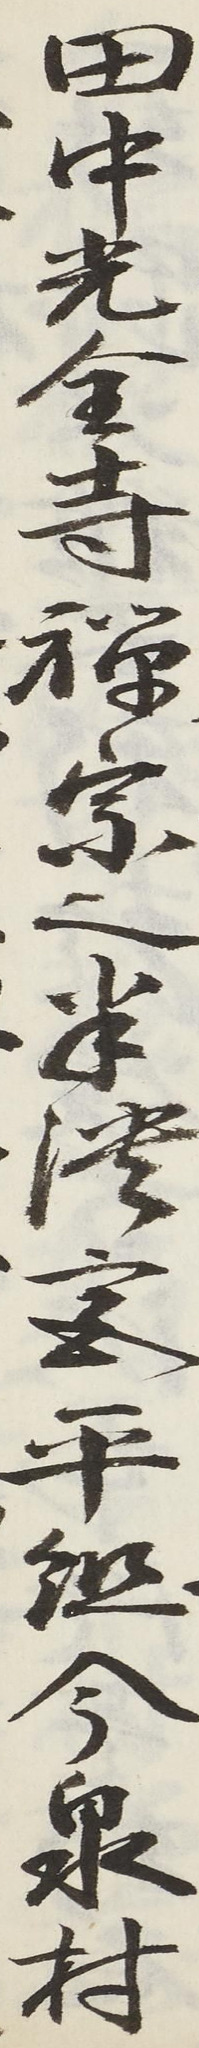田中光全寺禅宗也半潰宮平組今泉村
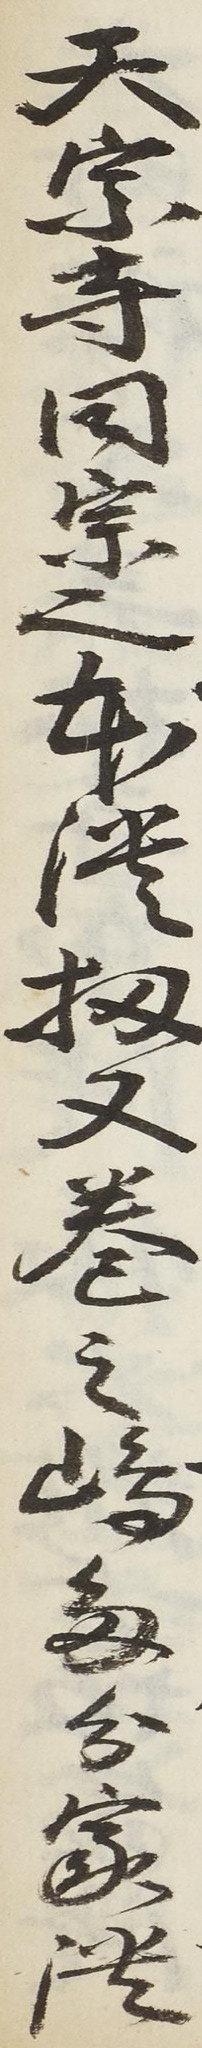天宗寺同宗也本潰扨又巻之嶋多分家潰

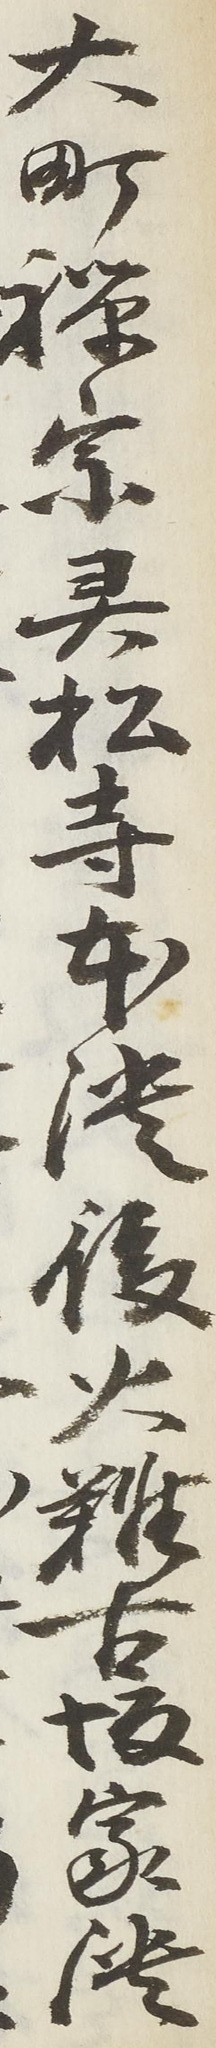大町禅宗霊松寺本潰後火難古坂家潰
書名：弘化四年地震記
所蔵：東京大学地震研究所図書室 Earthquake Research Institute Library, The University of Tokyo, JAPAN
